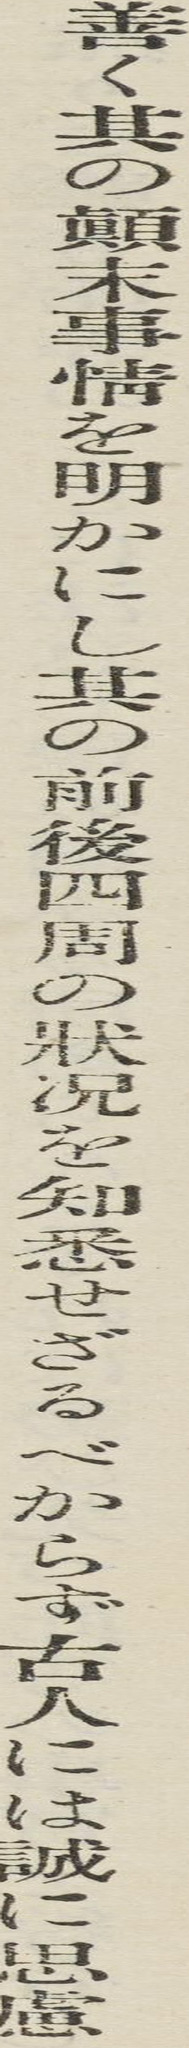善く其の顛末事情を明かにし其の前後四周の状況を知悉せざるべからず古人には誠に思慮
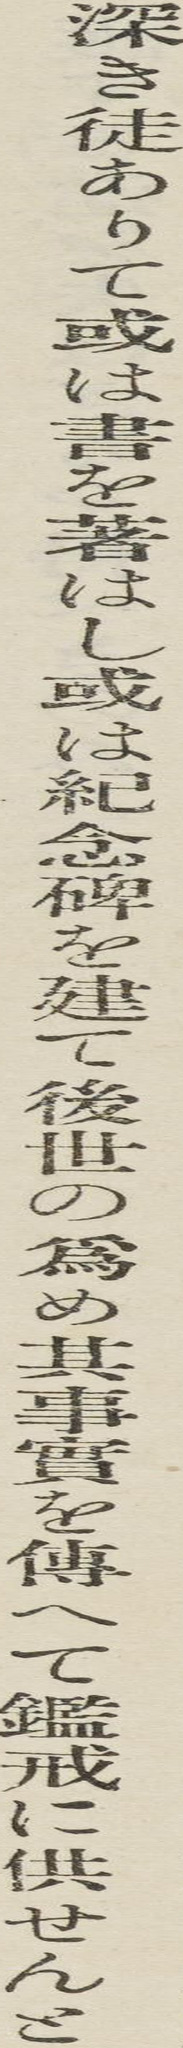深き徒ありて或は書を著はし或は記念碑を建て後世の為め其事実を伝えて鑑戒に供せんと
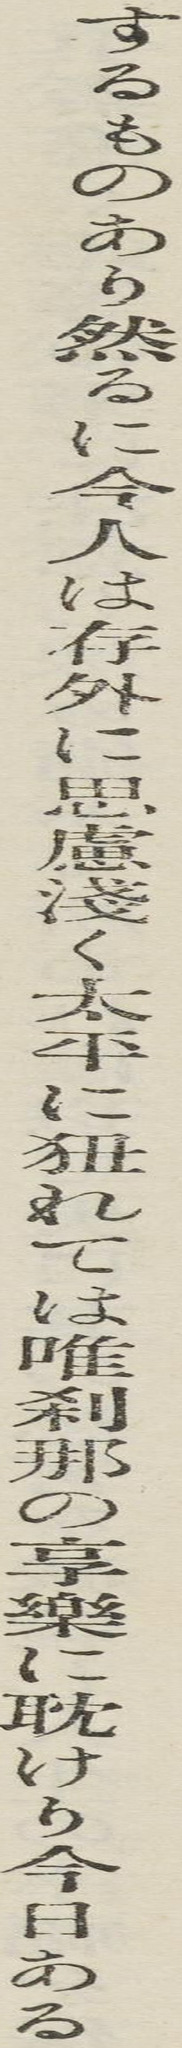するものあり然るに今人は存外に思慮浅く太平に狃れては唯刹那の享楽に耽けり今日ある
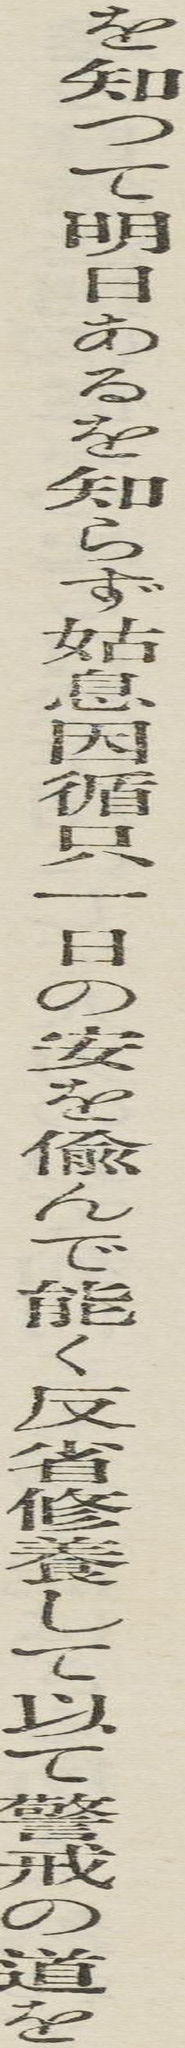を知って明日あるを知らず姑息因循只一日の安を偸んで能く反省修養して以て警戒の道を
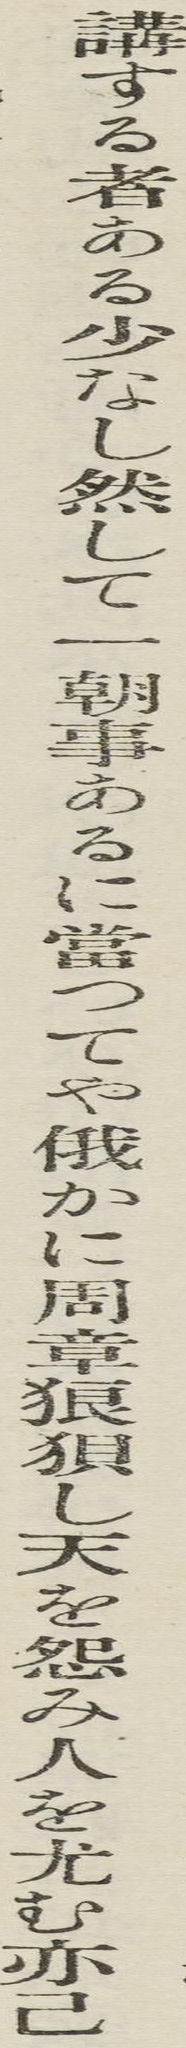講する者ある少なし然して一朝事あるに当つてや俄かに周章狼狽し天を怨み人を尤む亦己
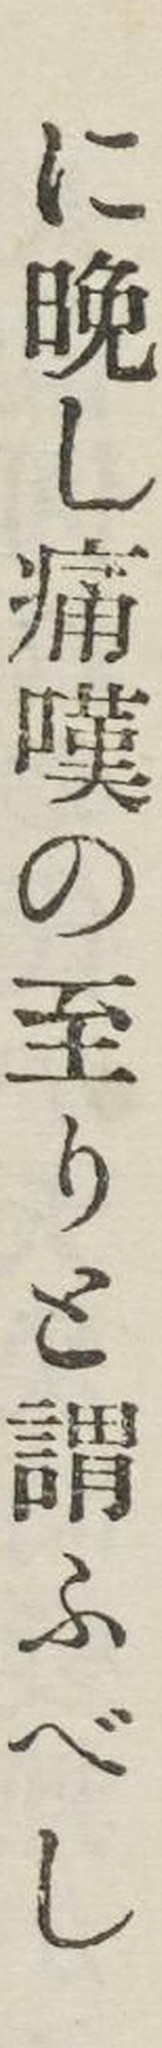に晩し痛嘆の至りと謂ふべし
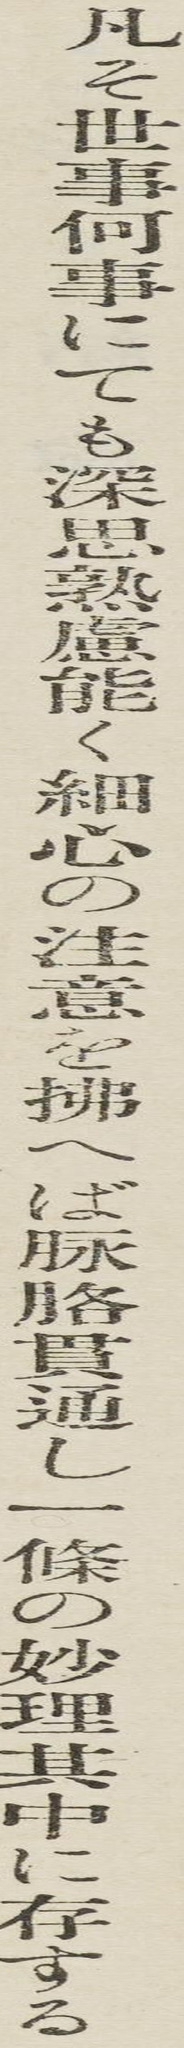凡そ世事何事にても深慮熟慮能く細心の注意を払へば脉胳貫通し一条の妙理其中に存する
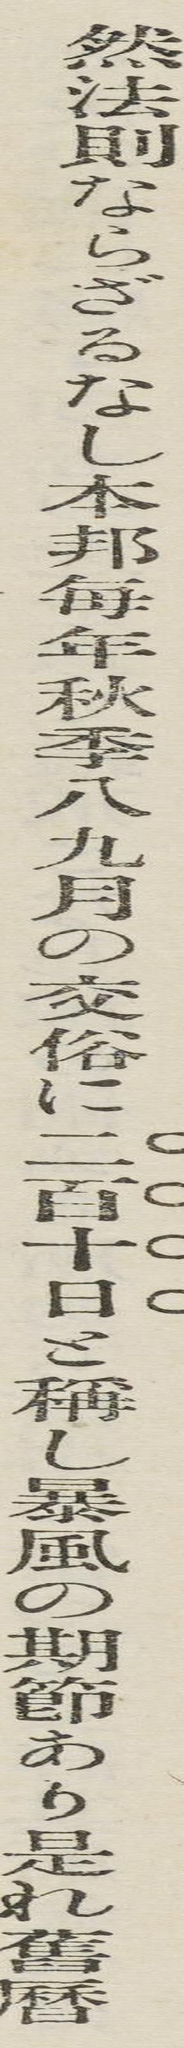然法則ならざるなし本邦毎年秋季八九月の交俗に二百十日と称して暴風の期節あり是れ旧暦
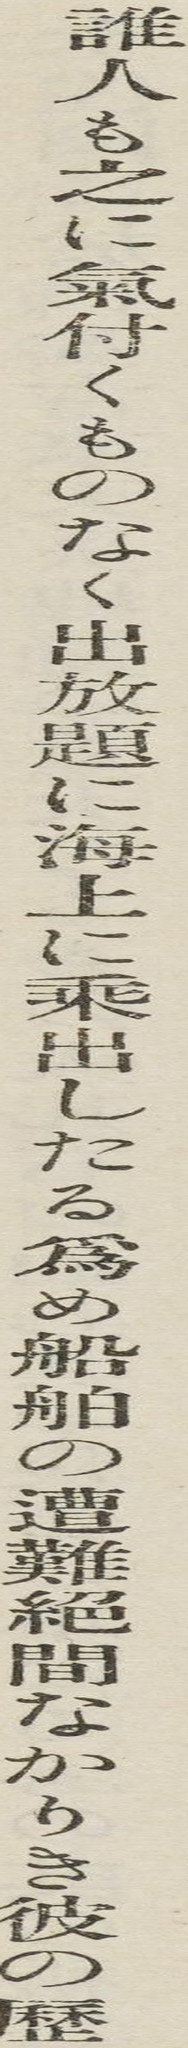誰人も之に気付くものなく出放題に海上に乗出したる為め船舶の遭難絶間なかりき彼の歴
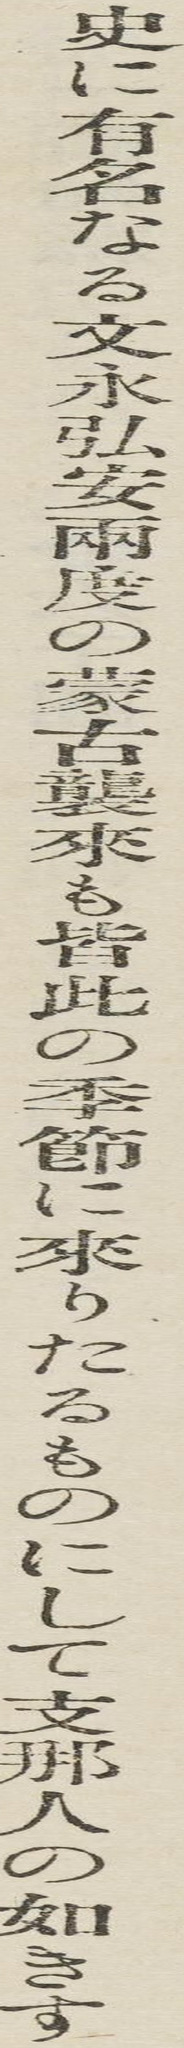史に有名なる文永弘安両度の蒙古襲来も皆此の季節に来りたるものにして支那人の如きす
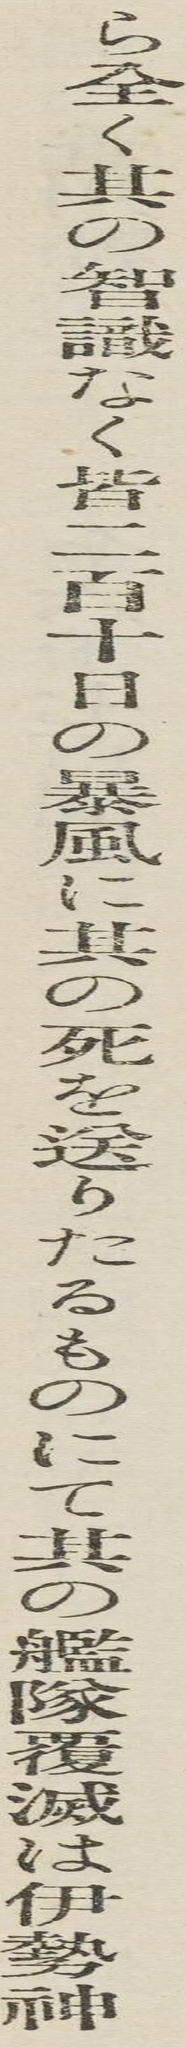ら全く其の知識なく皆二百十日の暴風に其の死を送りたるものにて其の艦隊覆滅は伊勢神
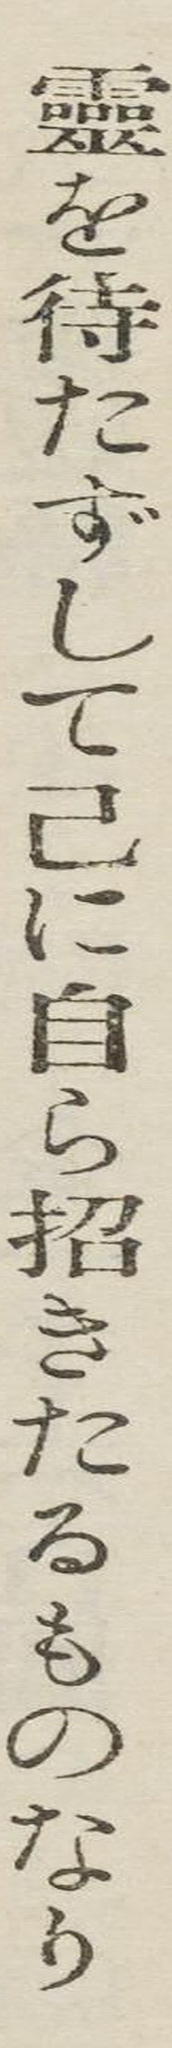霊を待たずして己に自ら招きたるものなり
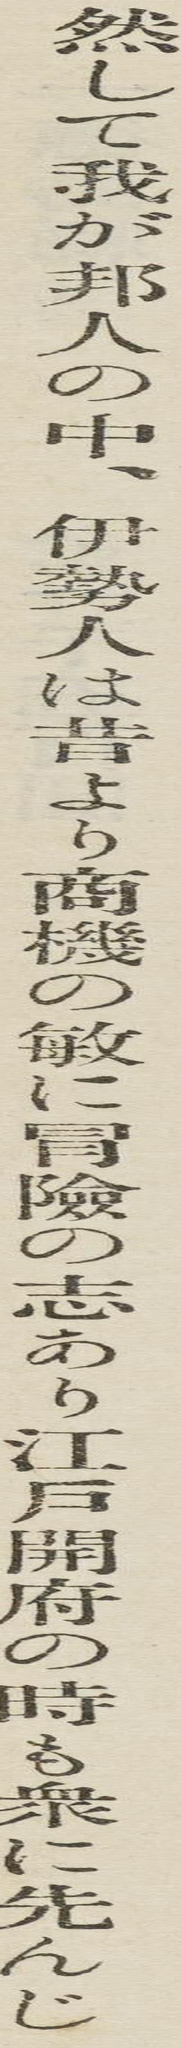然して我が邦人の中、伊勢人は昔より商機の敏に冒険の志あり江戸開府の時も衆に先んじ
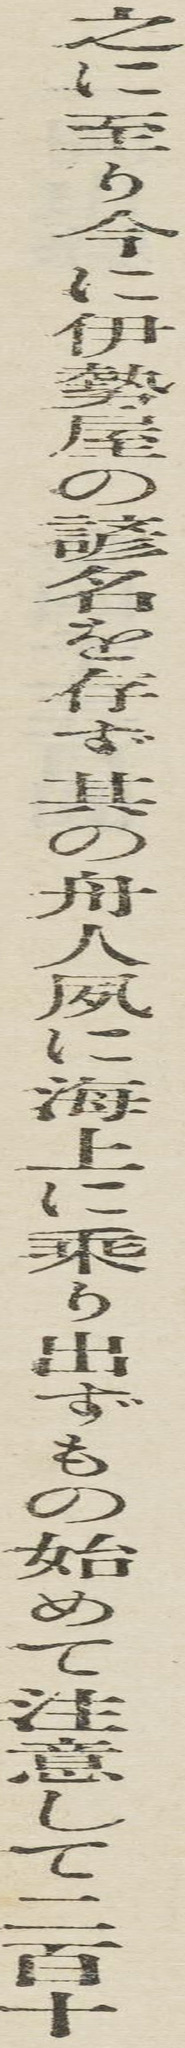之に至り今に伊勢屋の諺名を存ず其の舟人夙に海上に乗り出ずもの始めて注意して二百十
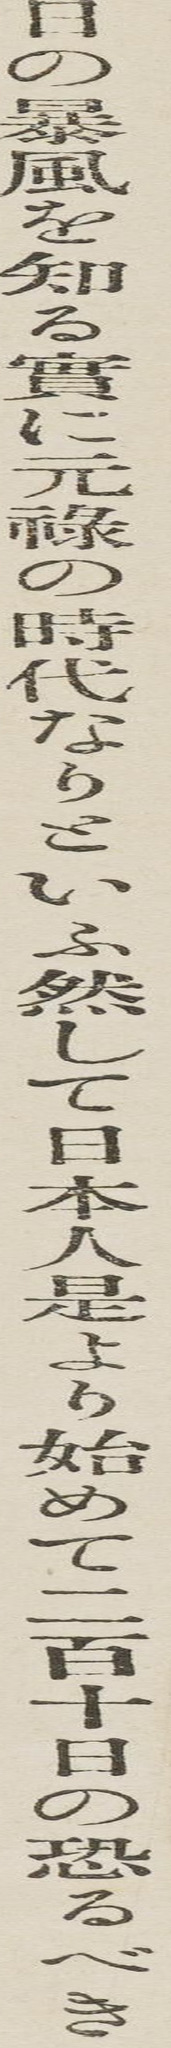日の暴風を知る実に元禄の時代なりといふ然して日本人是より始めて二百十日の恐るべき
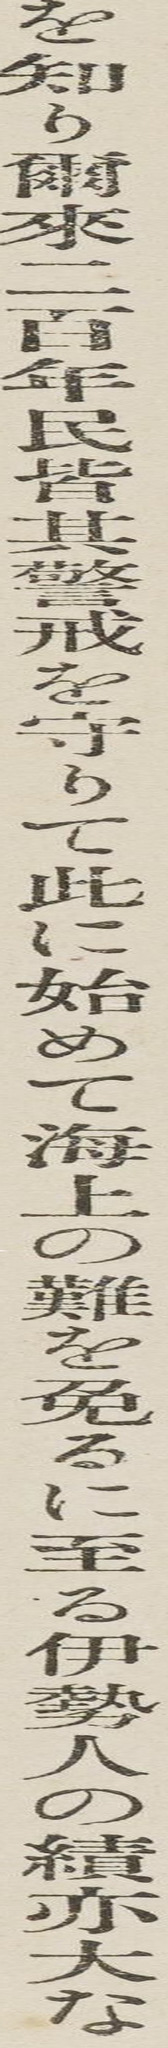を知り爾来二百年民皆其警戒を守りて此に始めて海上の難を免るに至る伊勢人の積亦大な
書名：土佐古今ノ地震
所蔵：東京大学地震研究所図書室 Earthquake Research Institute Library, The University of Tokyo, JAPAN
